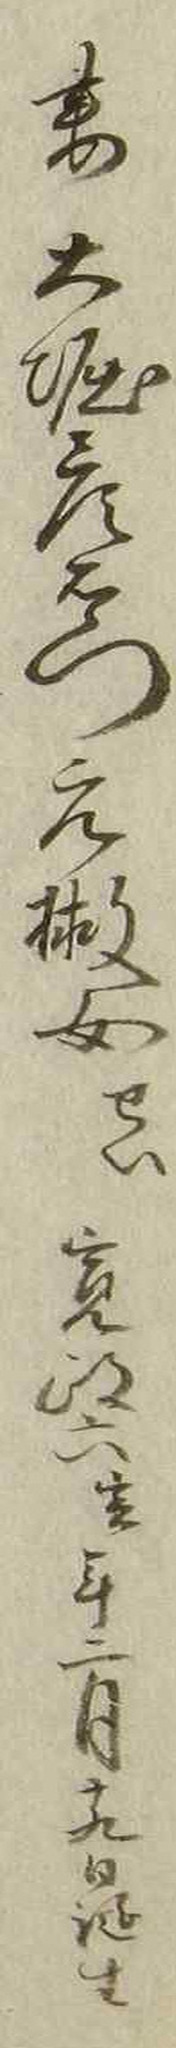妻大堀彦右衛門元女せい寛政六寅年二月十九日誕生
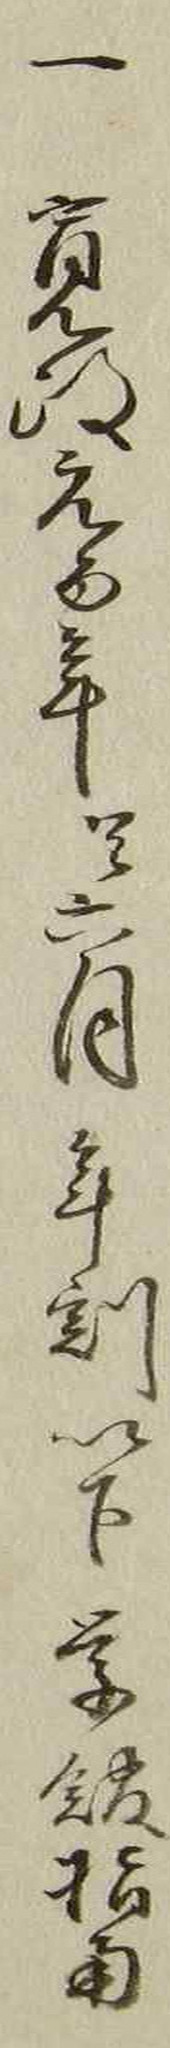一寛政元酉年閏六月年割以下学館指南
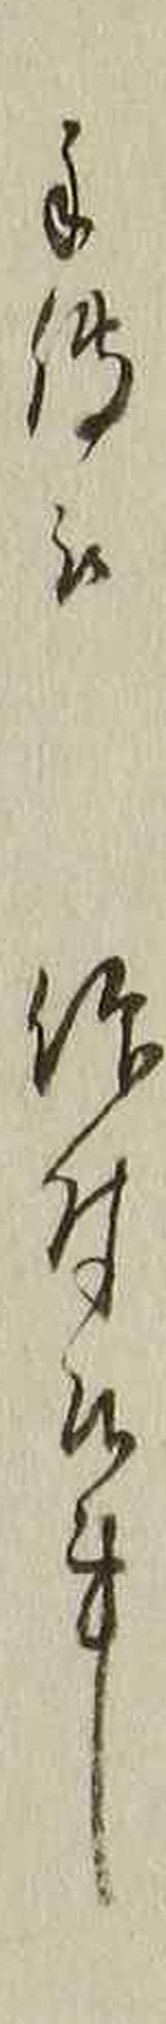手伝被仰付候事
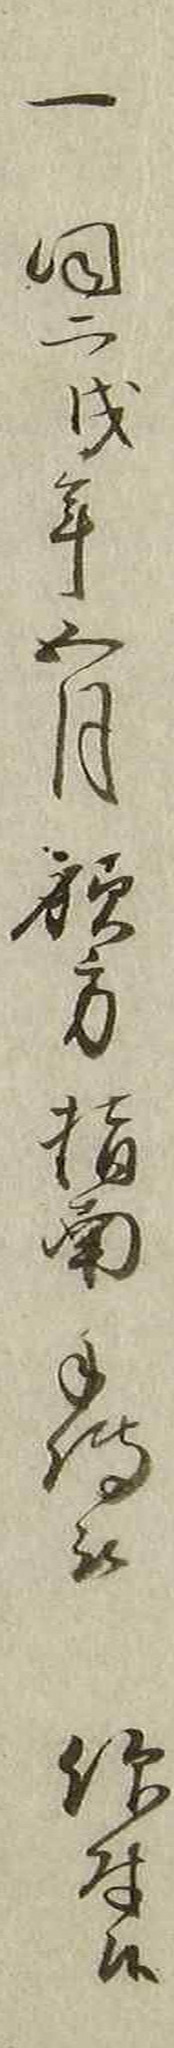一同二戊年五月躾方指南手伝被仰付候
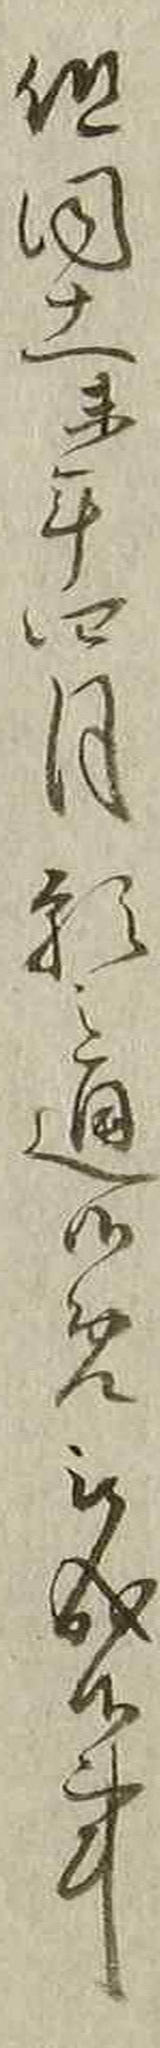但同十一未年四月願之通御免被成候事
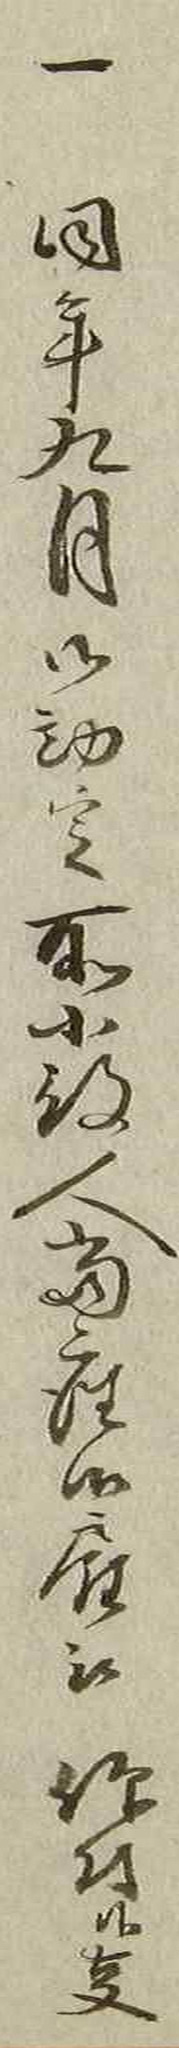一同年九月御勘定所小役人当座御雇被仰付事
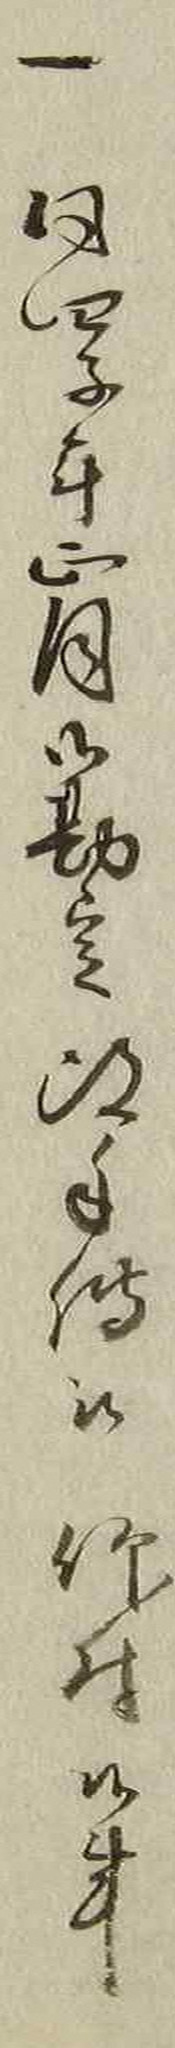一同四子年正月御勘定改手伝被仰付候事
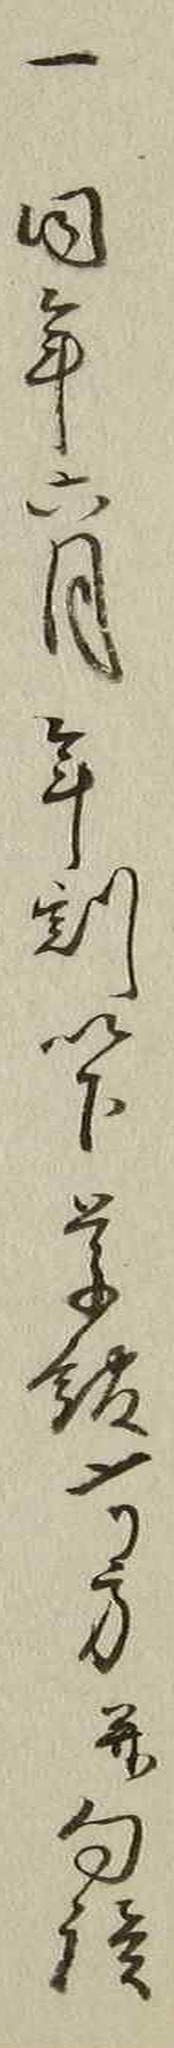一同年六月年割以下学館〆り方并句読
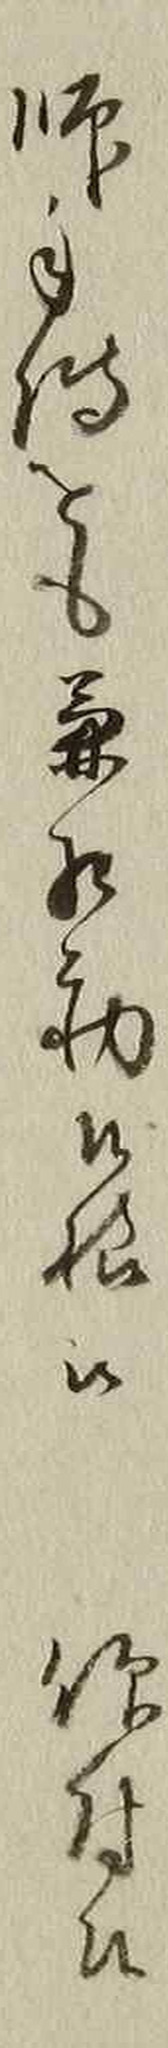師手伝をも兼相勤候様被仰付候
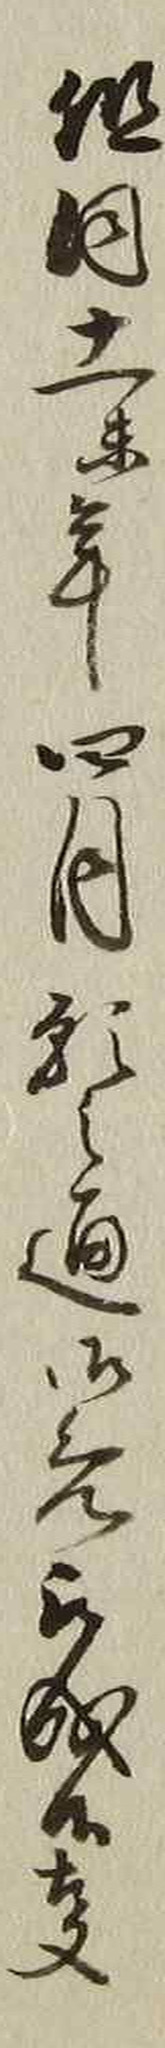但同十一未年四月願之通御免被成候事
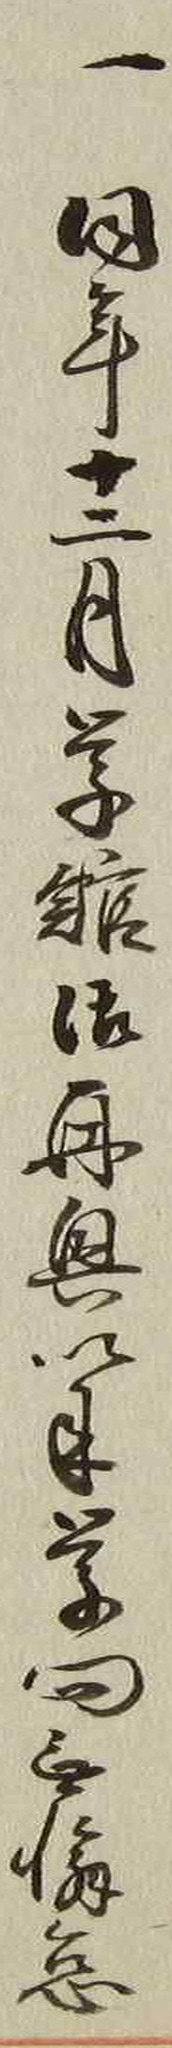一同年十二月学館御再興以来学問無懈怠
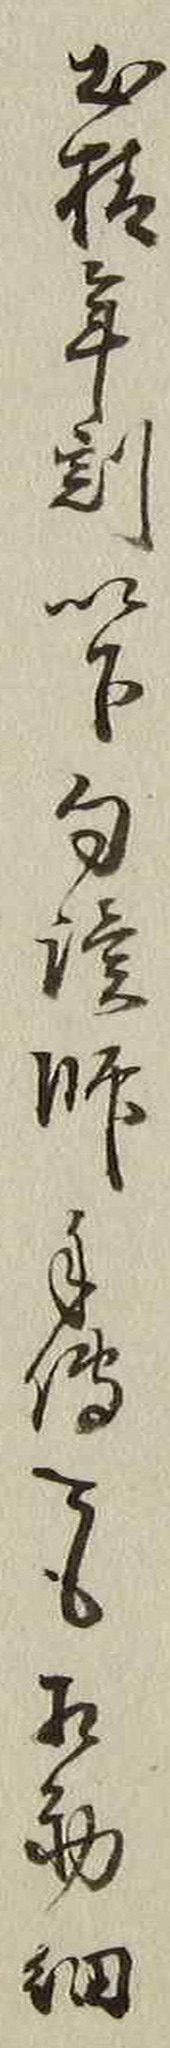出精年割以下句読師手伝をも相勤細
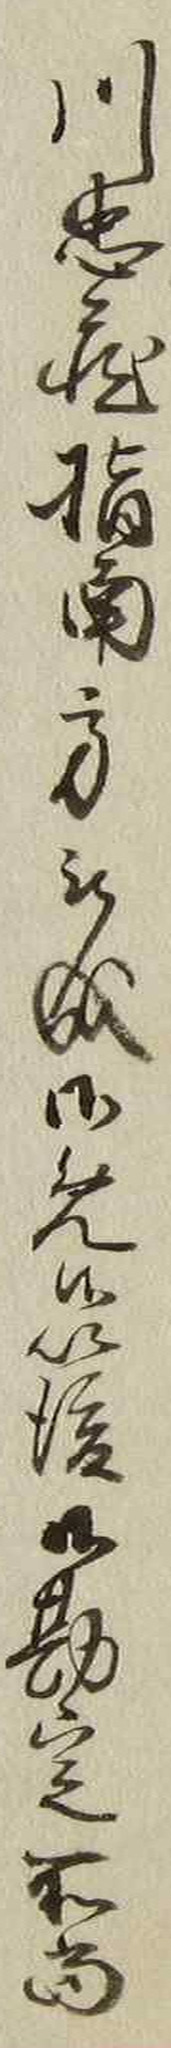川忠蔵指南方被成御免候以後御勘定所当
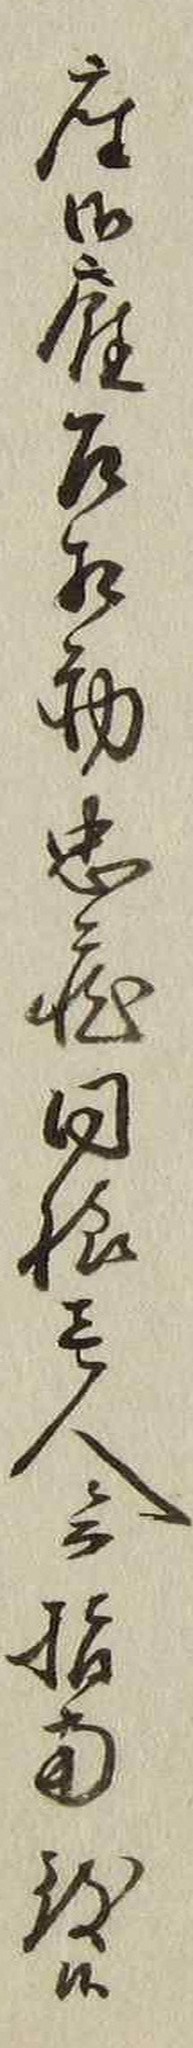座御雇乍相勤忠蔵同様壱人ニ而指南致候
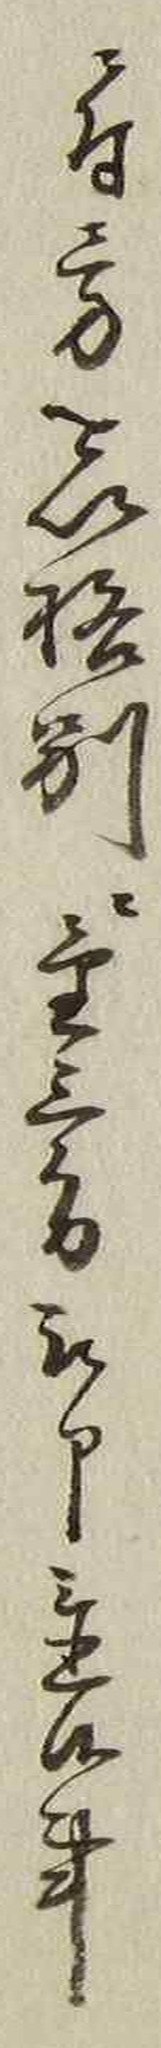ニ付旁を以格別ニ金三分被申置候事
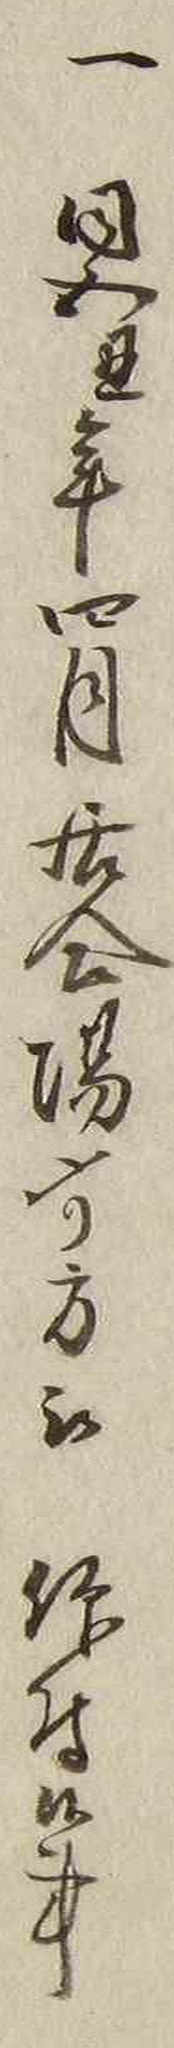一同五丑年四月居合場〆り方被仰付候事
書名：諸士系譜　巻之132　た之部8
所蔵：会津若松市立会津図書館
